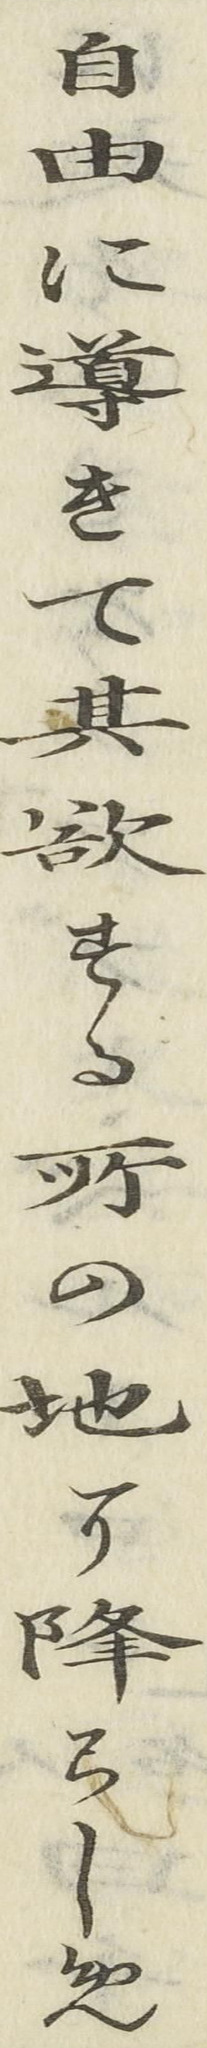自由に導きて其欲する所の地に降ろしめ
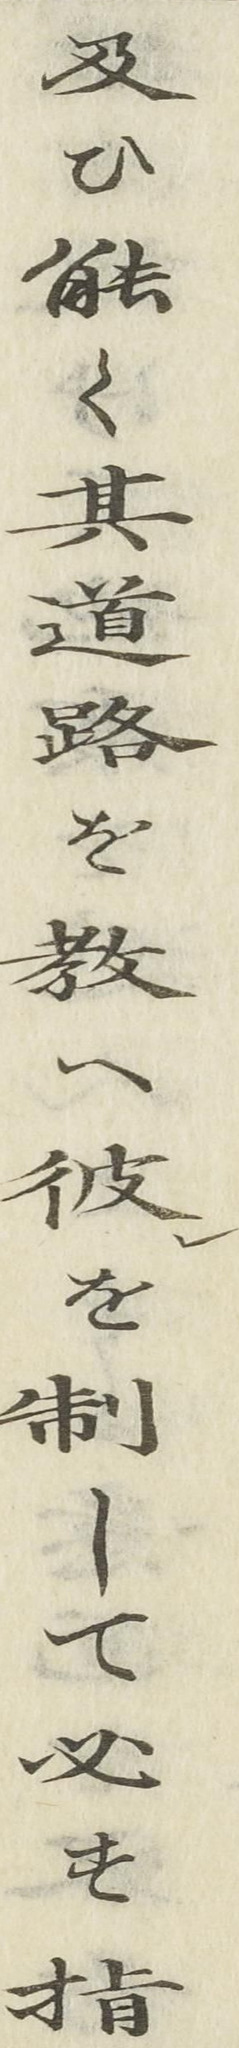及び能く其道路を教え彼れを制して必ず指
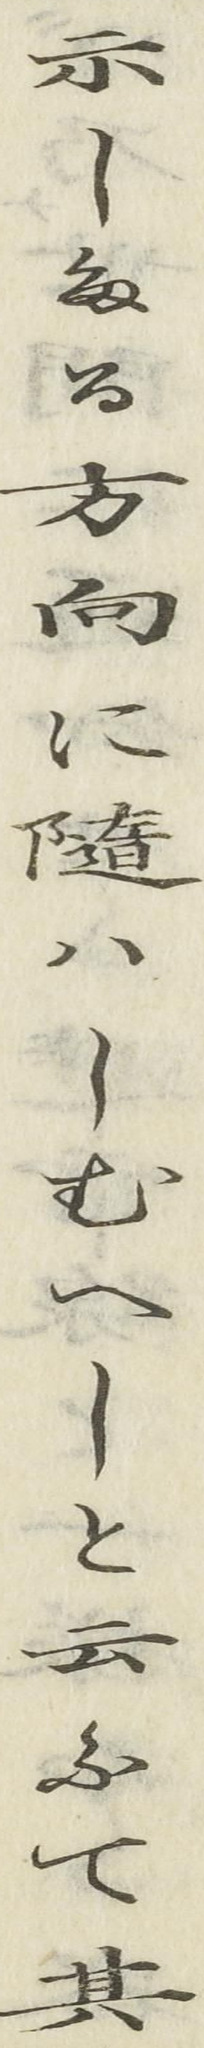示したる方向に随はしむべしと云ふて其
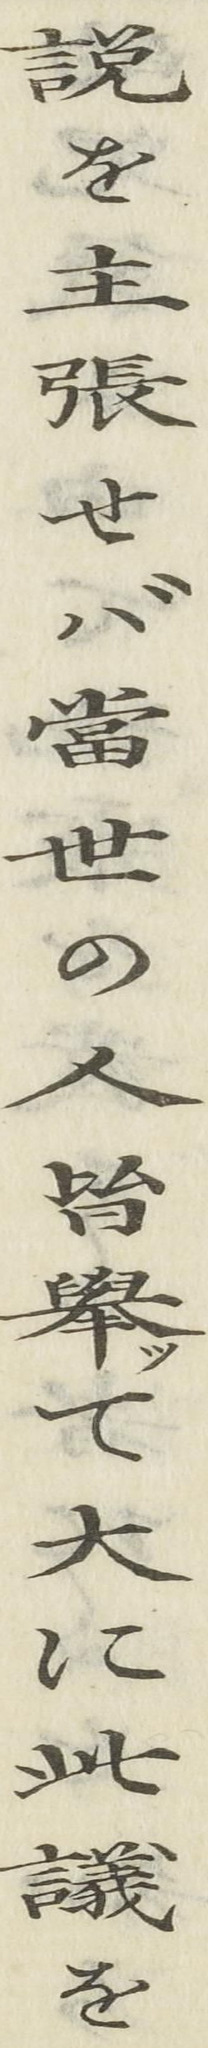説を主張せば当世の人皆挙て大に此議を
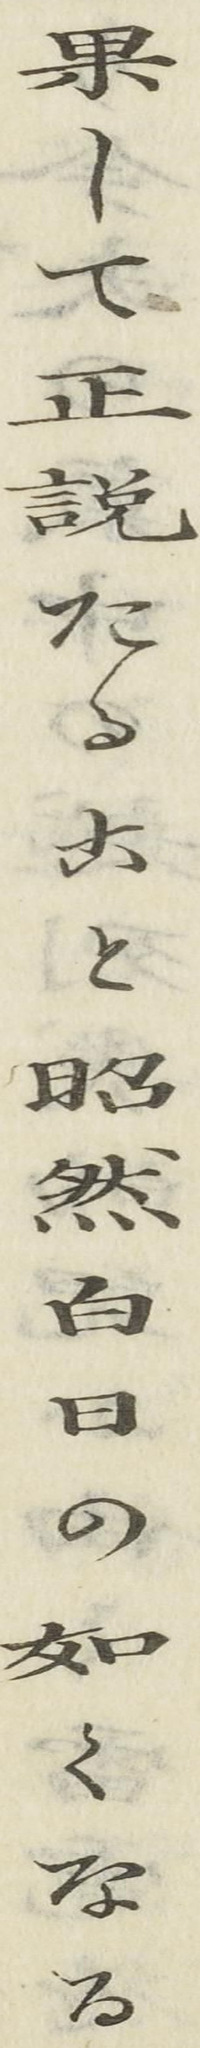果して正説たること昭然白日の如くなる
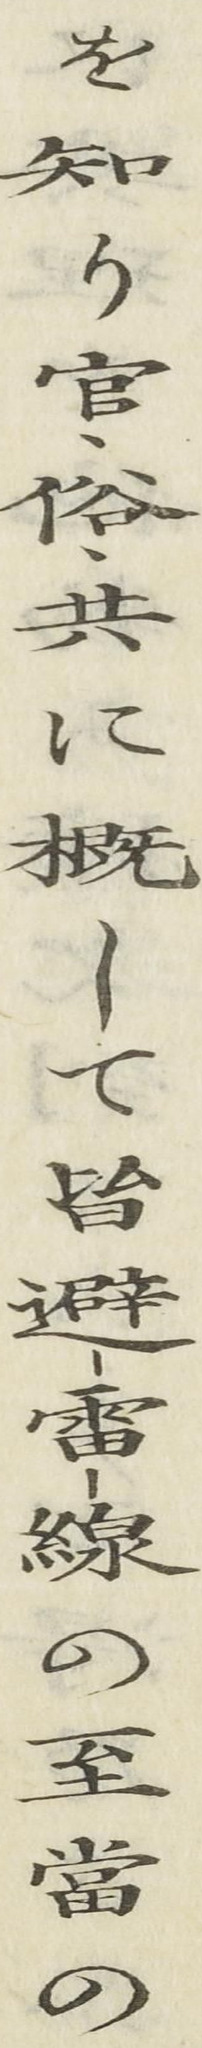を知り官々俗々共に概して皆避雷線の至当の
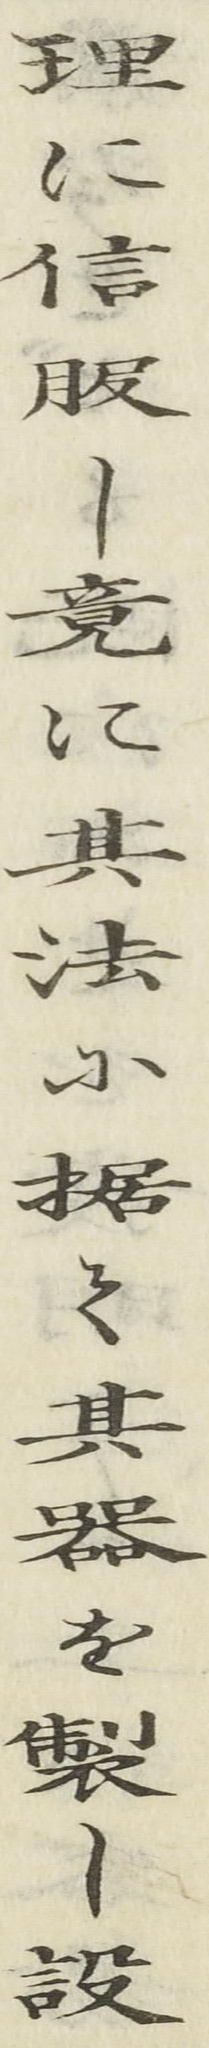理に信服し竟に其法に据て其器を製し設
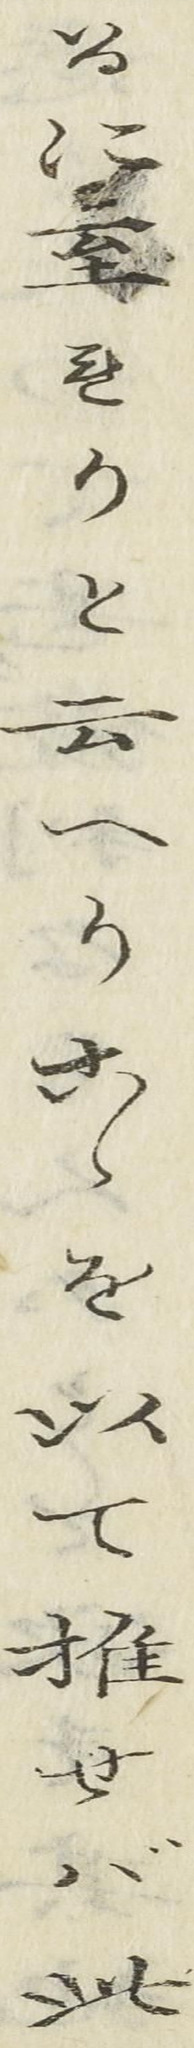るに至れりと云へりこゝを以て推せば此
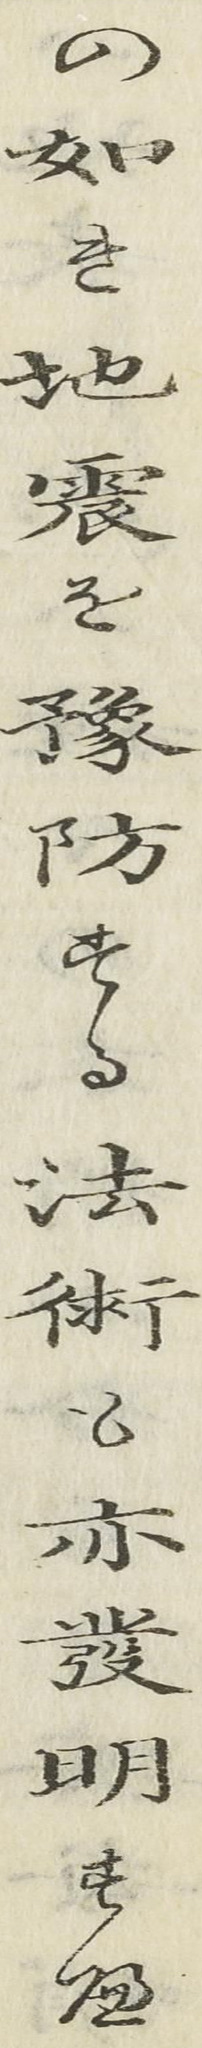の如き地震を預防する法術も亦発明すべ
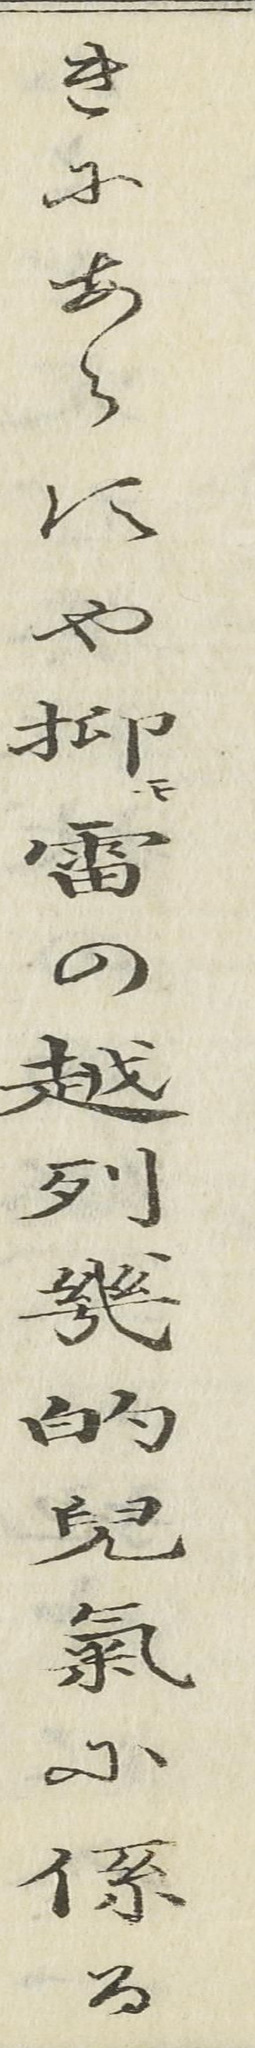きにあらすや抑も雷の越列幾的児気に係る
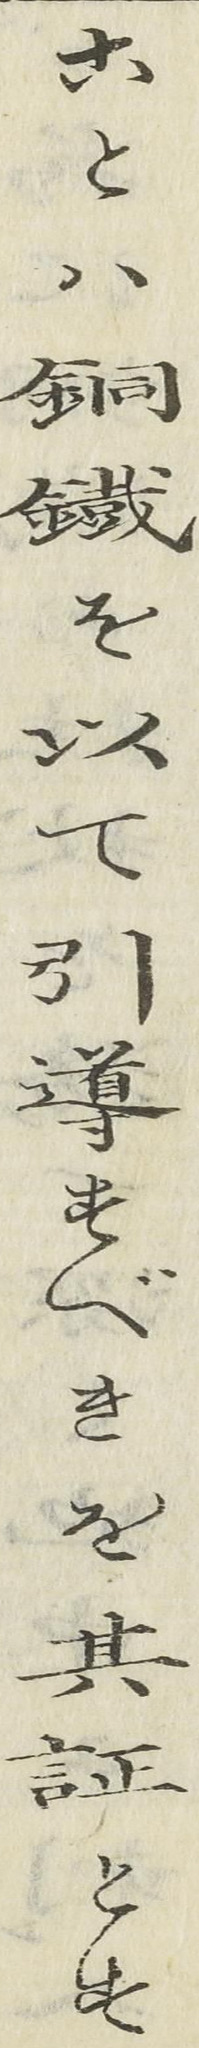ことは銅鉄を以て引導すべきを其証とす
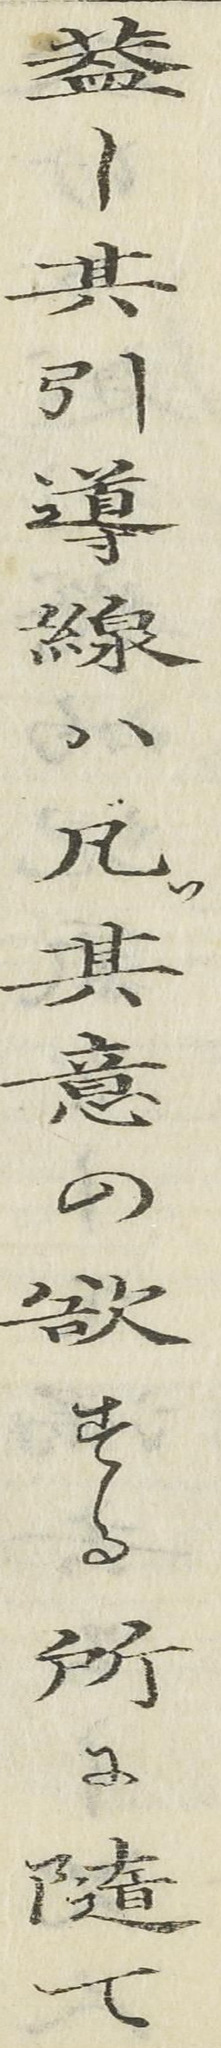蓋し其引導線は凡そ其意の欲する所に随て
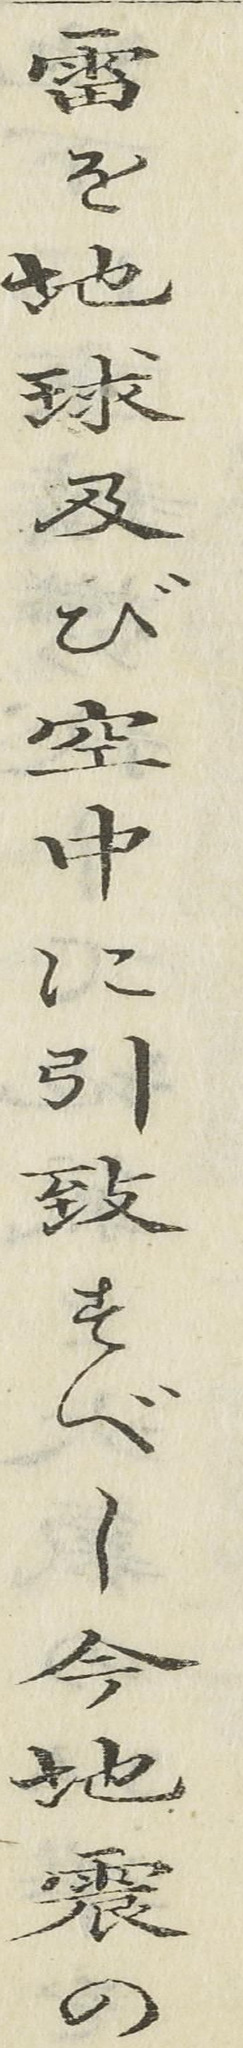雷を地球及び空中に引致すべし今地震の
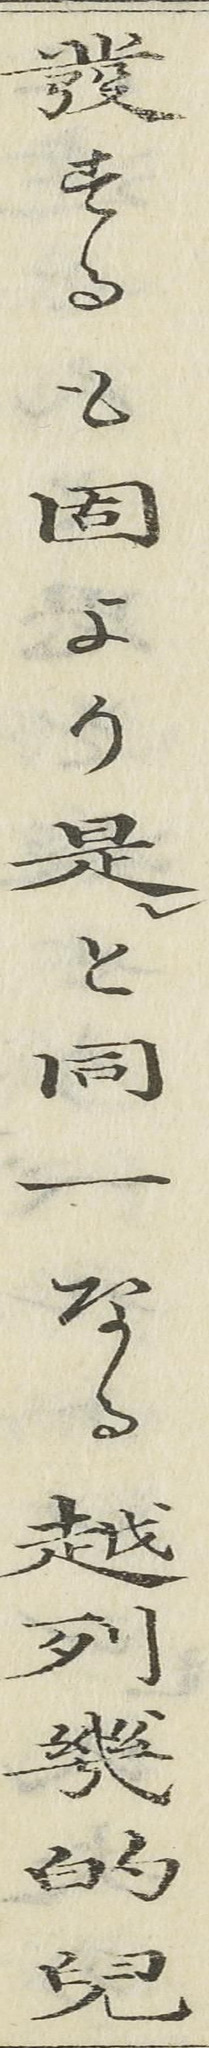発するも固より是れと同一なる越列幾的児
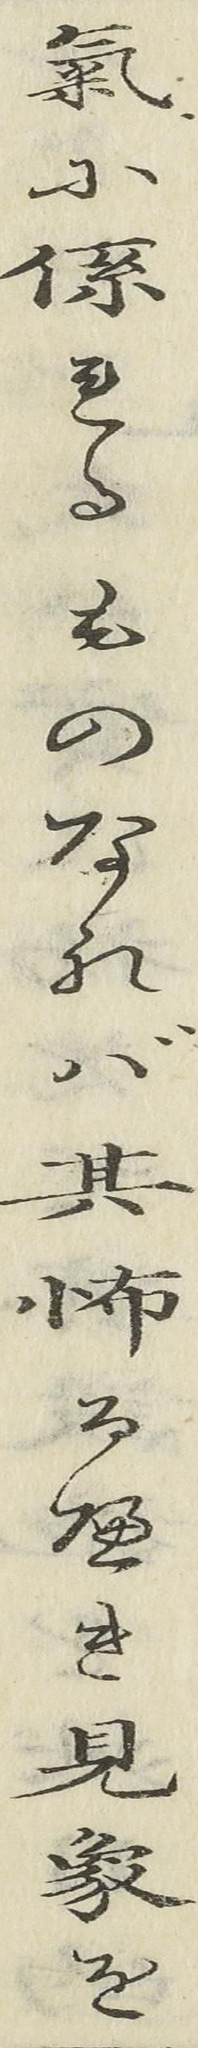気に係れるものなれば其恐るへき見象を

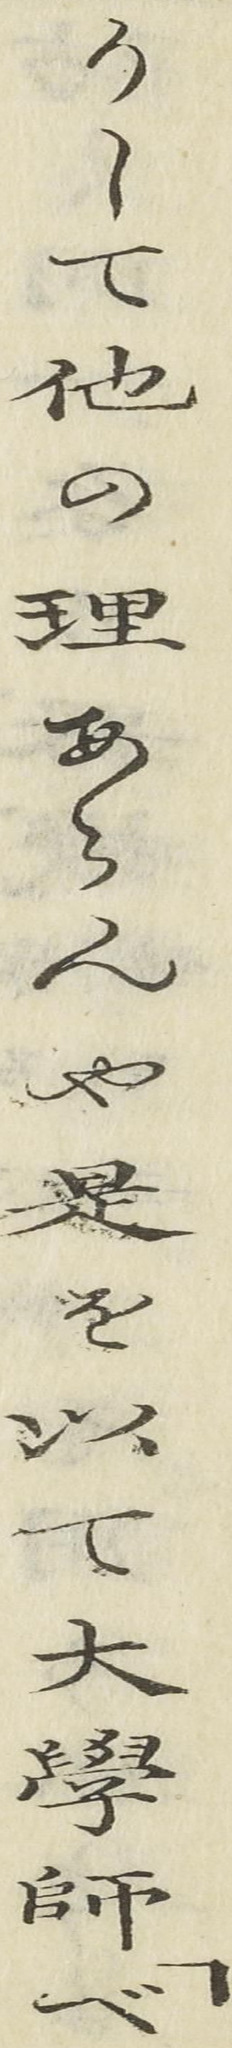りして他の理あらんや是を以て大学師「ベ
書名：地震預防説
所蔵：東京大学地震研究所図書室 Earthquake Research Institute Library, The University of Tokyo, JAPAN
